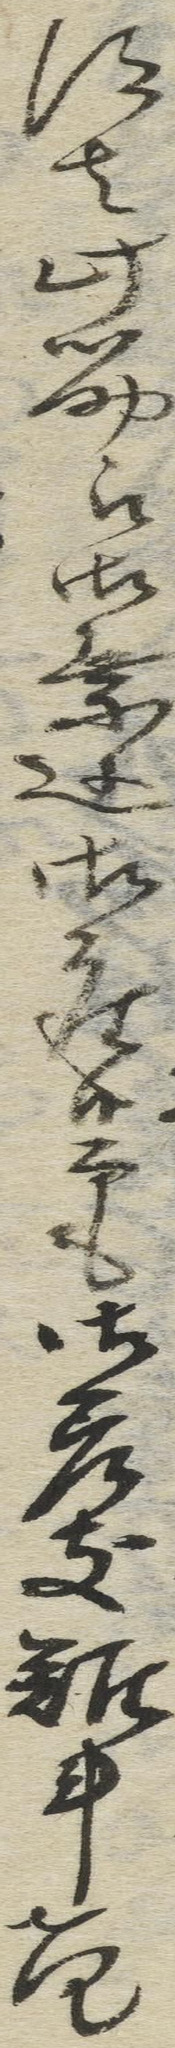得は此筋江御乗込御座候而も御差支難計如何
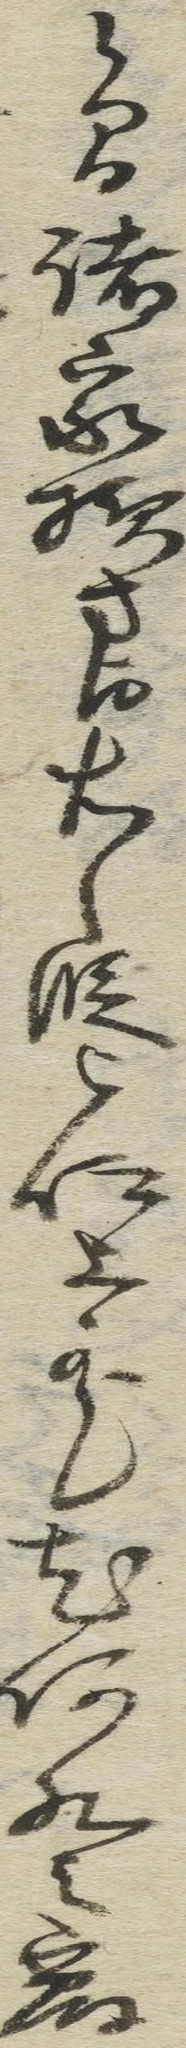候間諸家様方江右之段被仰上可申候尤何れ之宿
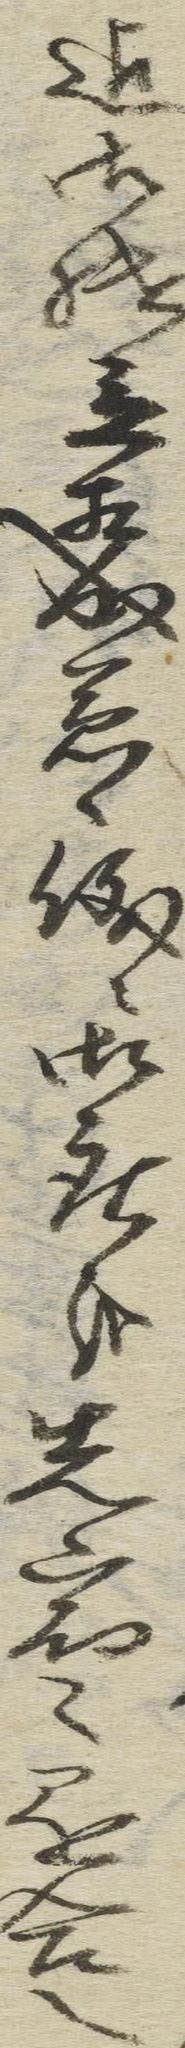迄御継立相成急候儀二御座候哉先宿々懸合之
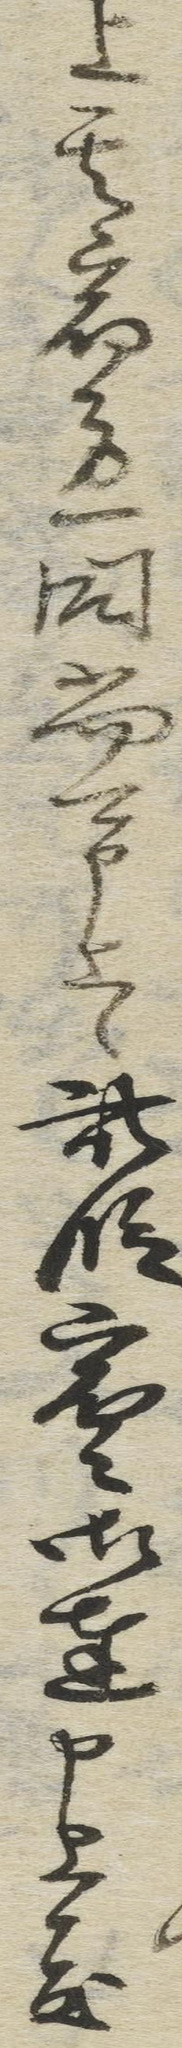上其宿方一同尚可申上候此段宿々御達申上度
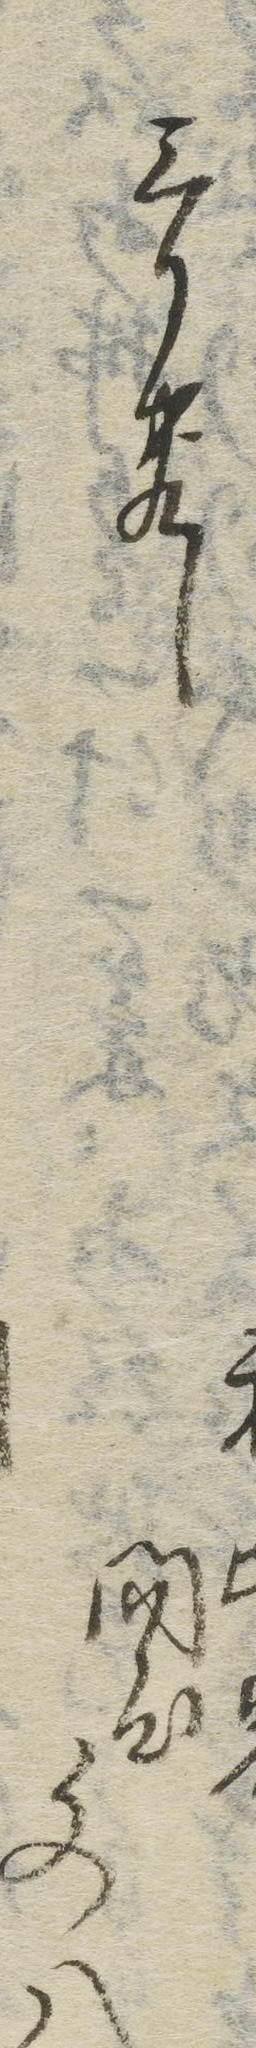三月廿九日問屋文八
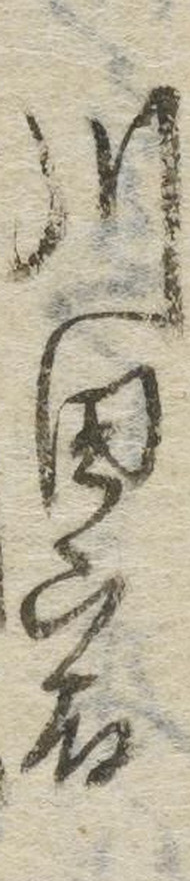川田宿
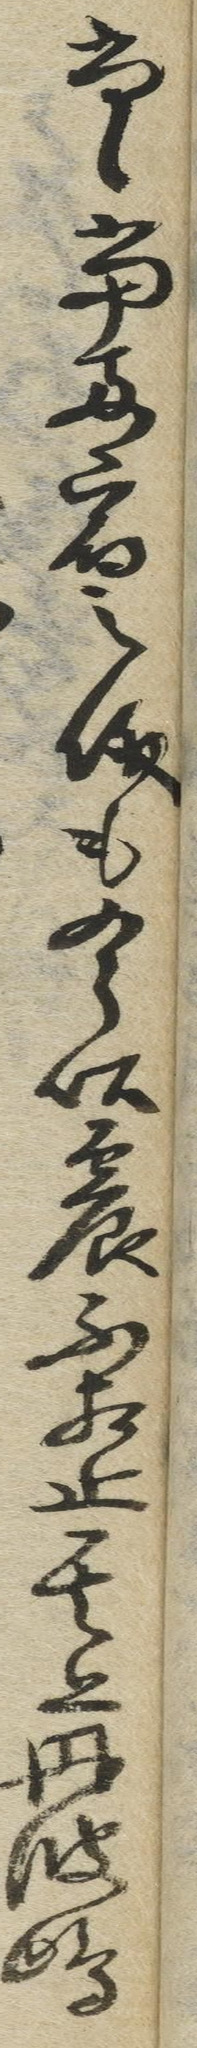尚々当両宿之儀も今以震相不止其上丹波嶋
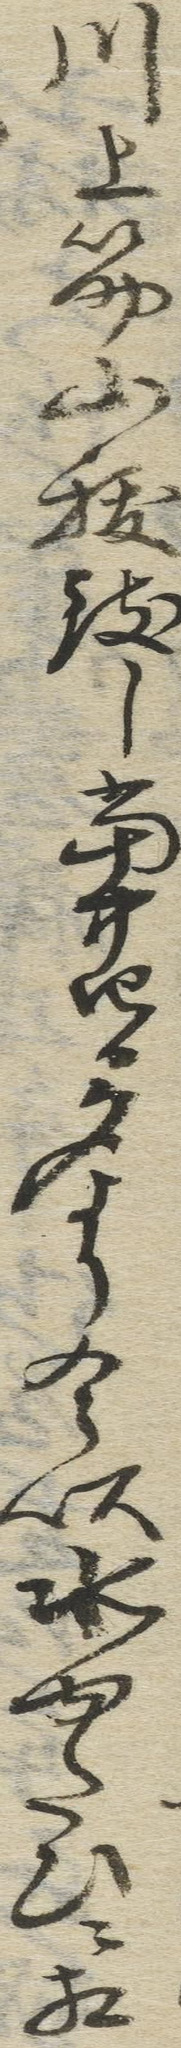川上筋山抜致し当廿四日夕より今以水たたひ二相
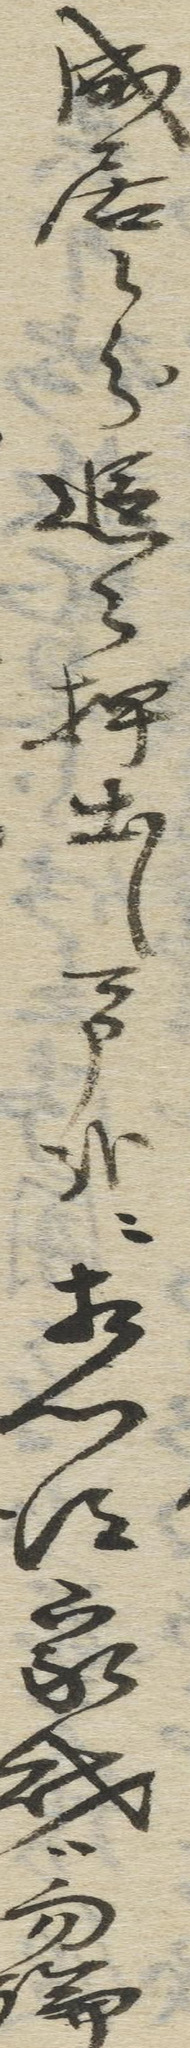成居候分追々押出し可申哉二相心得家財ハ勿論
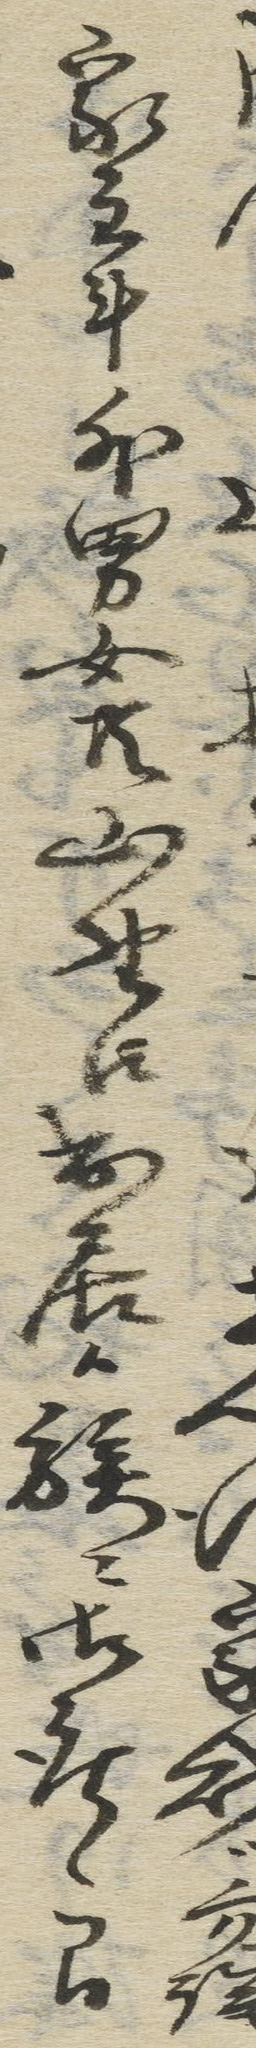家主計外男女共山野江出居候族二御座候間
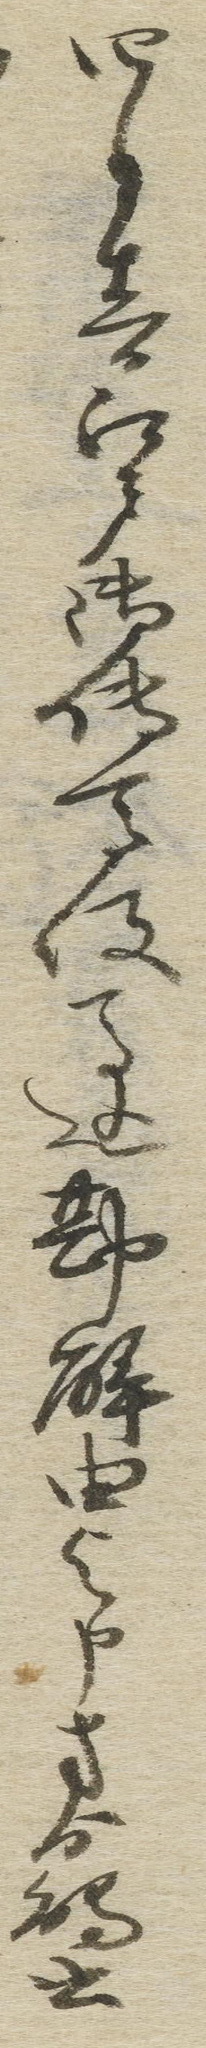四月十二日江戸御伝馬役馬込勘解由と申方ゟ触書
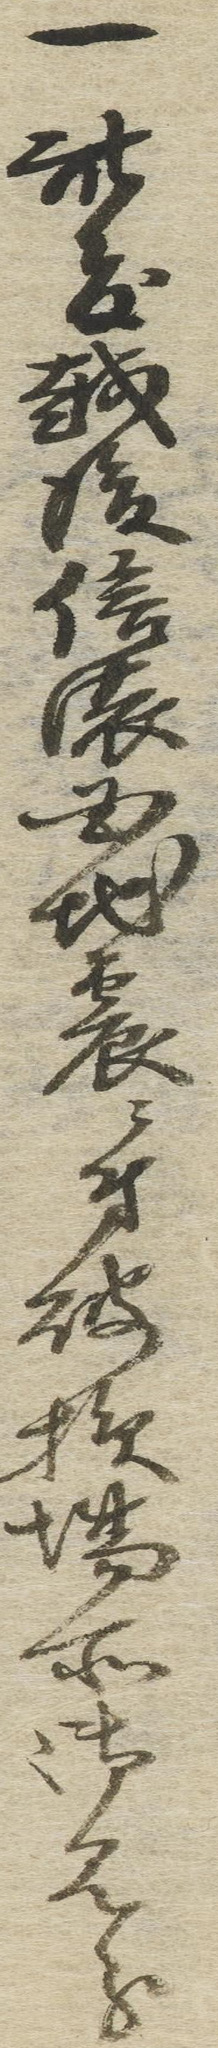一此度越後信濃国地震二付破損場所御見分
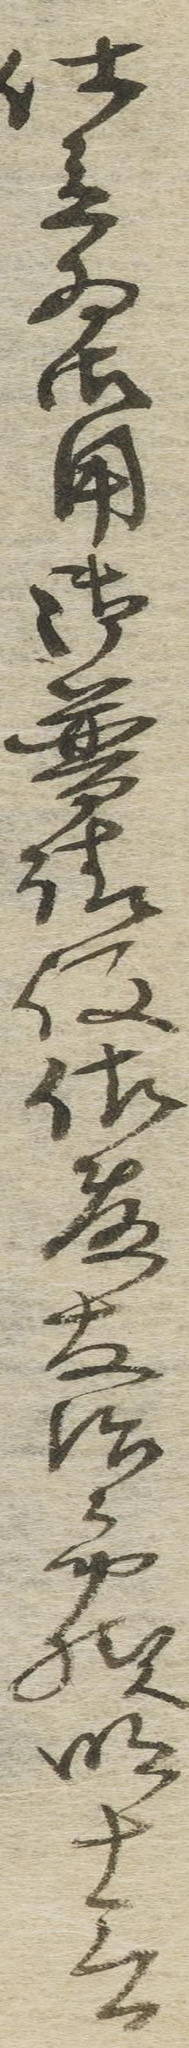仕立為御用御普請役佐藤友治郎様明十三日
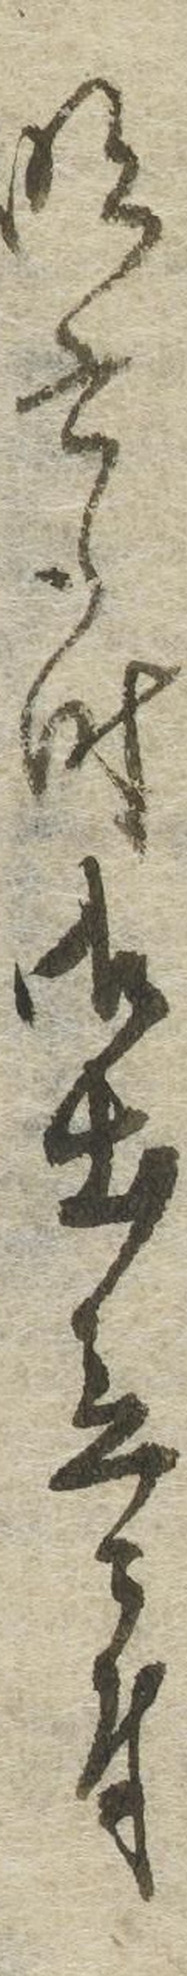明六ッ時御出立二付
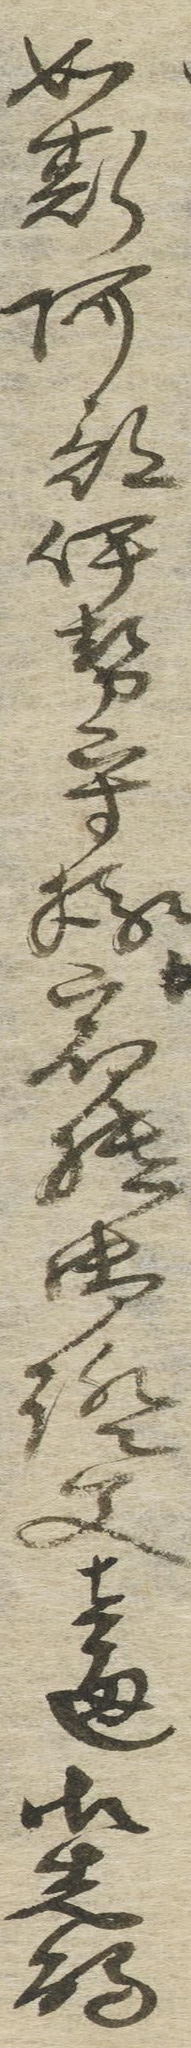如斯阿部伊勢守様宿継御訟文壱通御先触
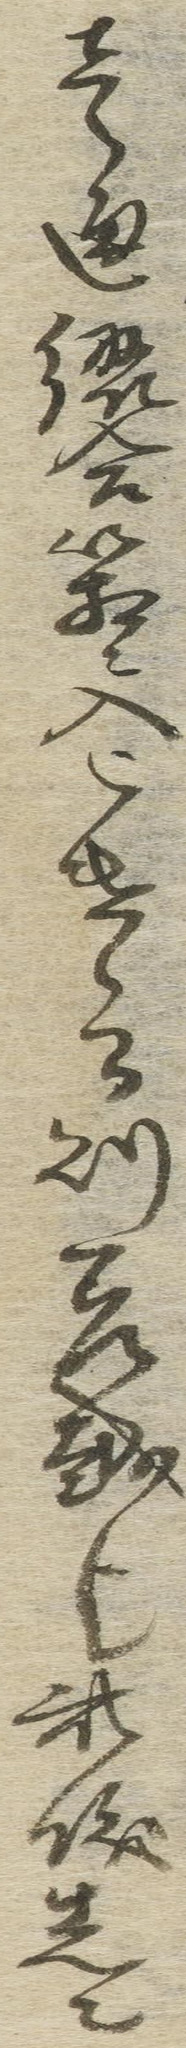壱通継合箱二入被遣候間則差越申候此儀先々
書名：信濃越後　地震書留
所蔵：東京大学地震研究所図書室 Earthquake Research Institute Library, The University of Tokyo, JAPAN
